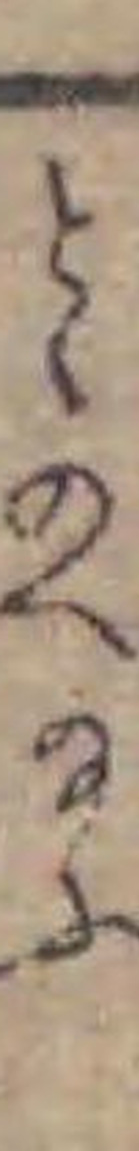とゝのへ給ふ
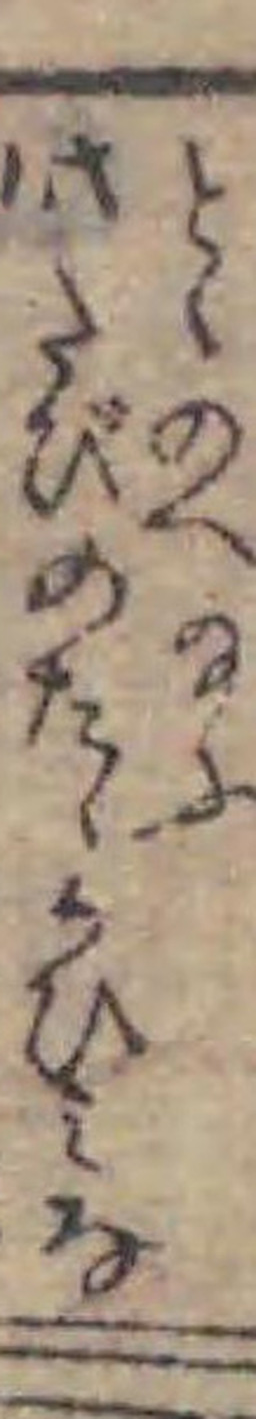此たびのたゝかひみな
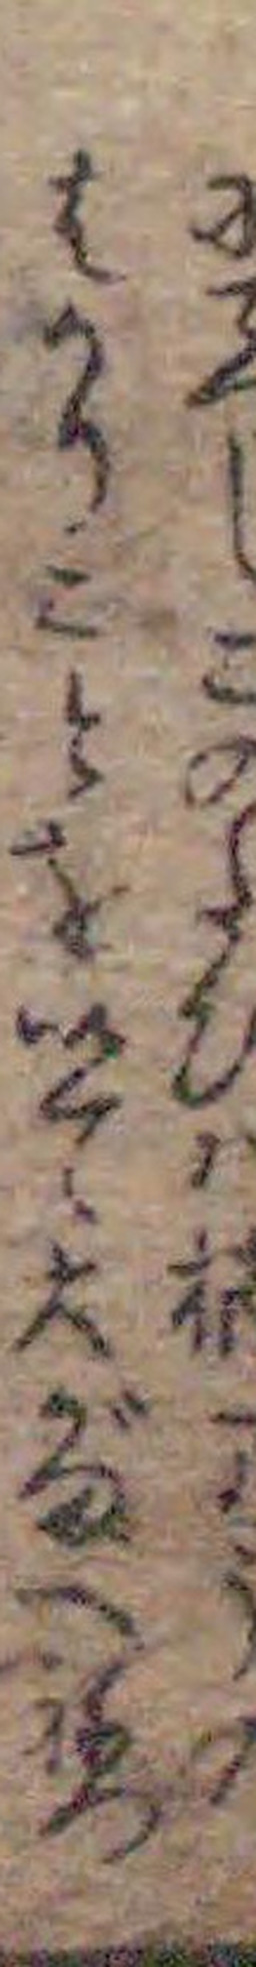はかりことを以て大がまへねつ
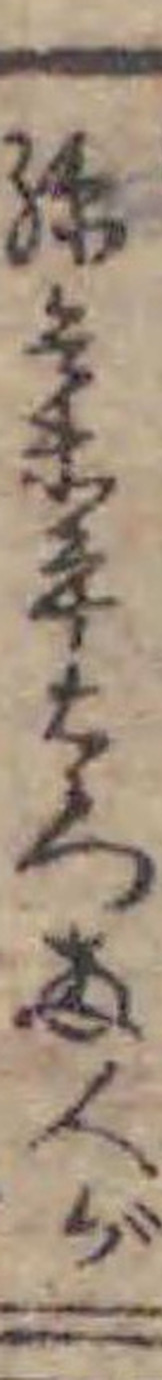孫兵衛平右衛門両人が
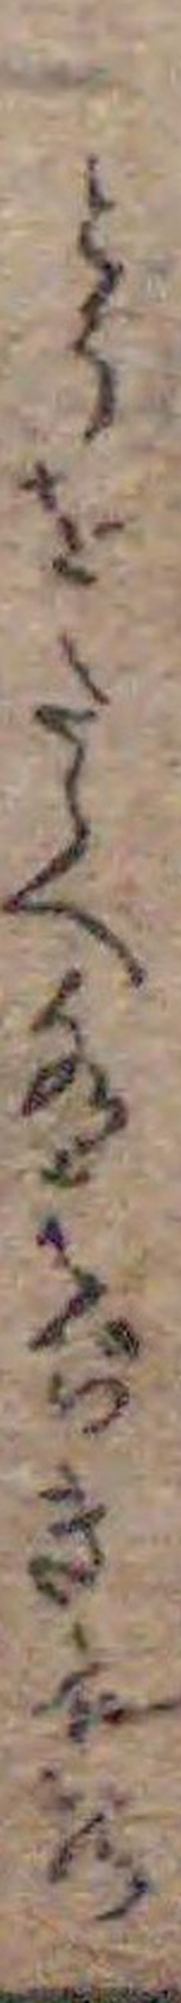とうをたゝへ水はぢき飛竜
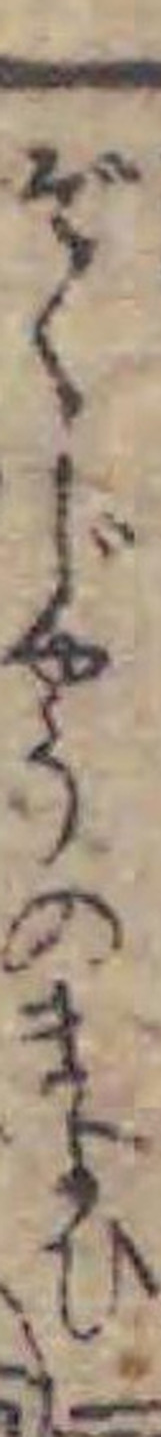ぞくじやうのまよひ
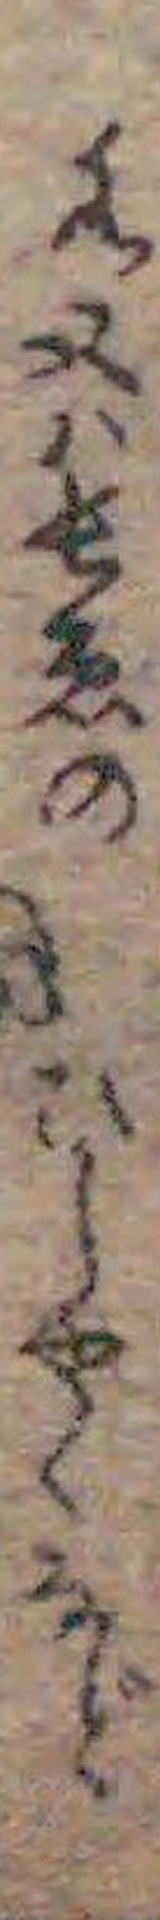水又は長ゑのひしやくなど
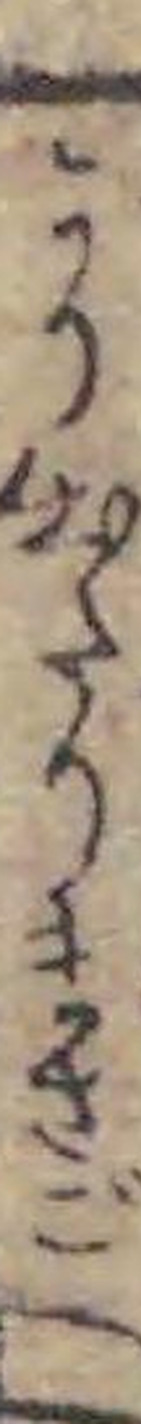より出たりまさご
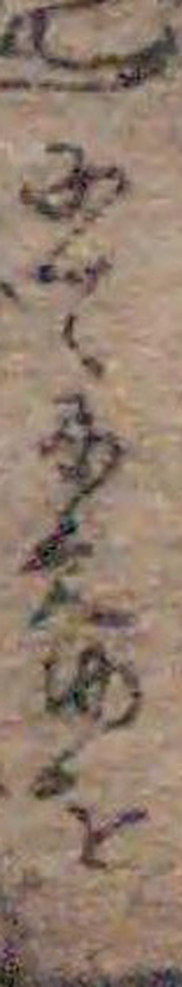にてにえゆを
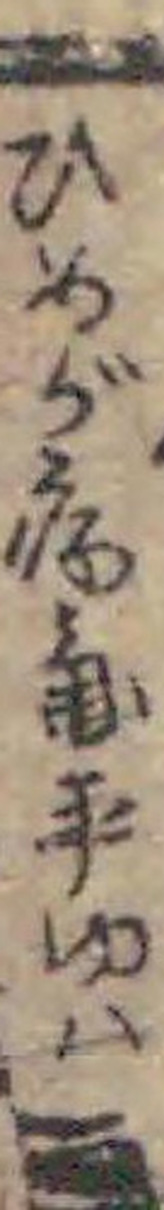ひめが病気平ゆは
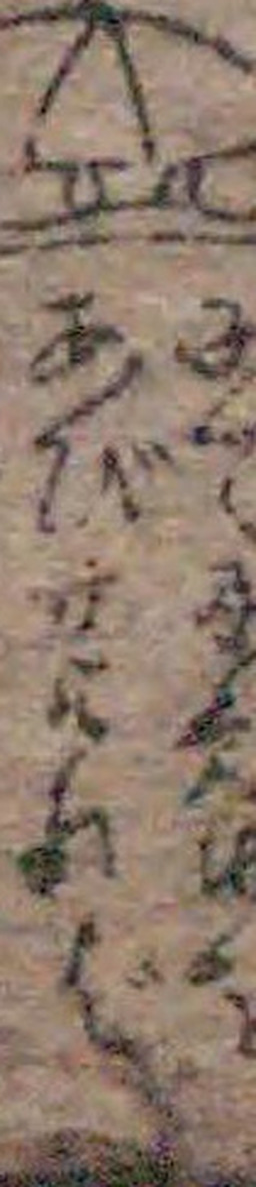あびせければ
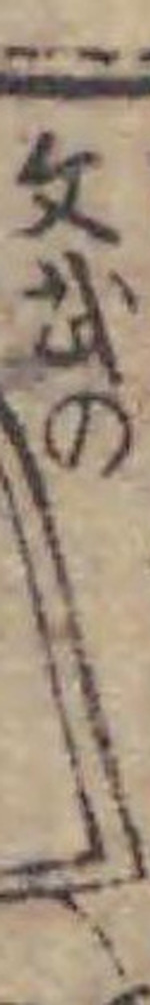文武の
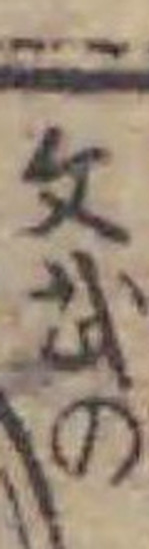文武の
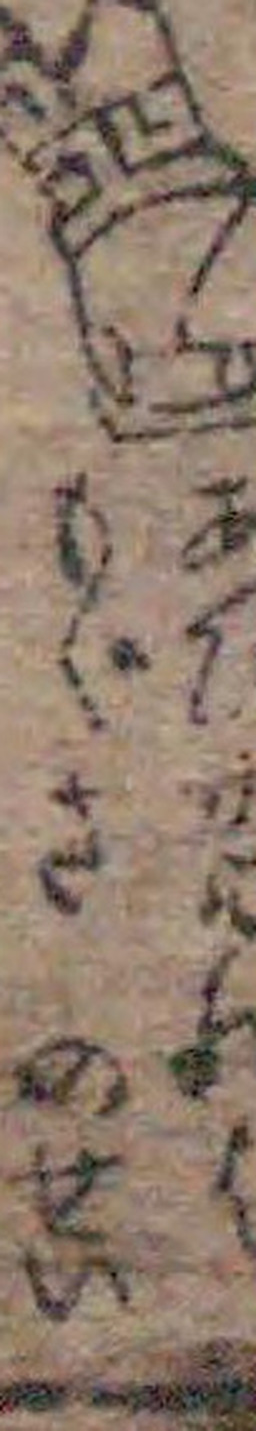もぐさのせい
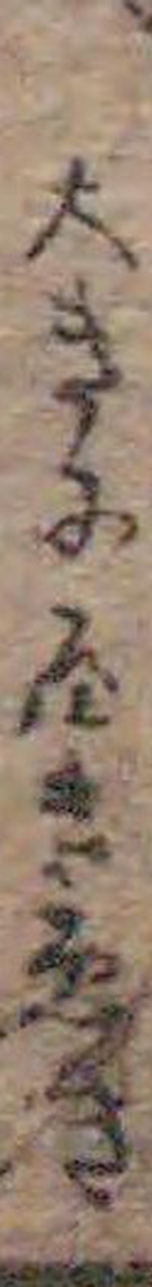大きにへきゑき
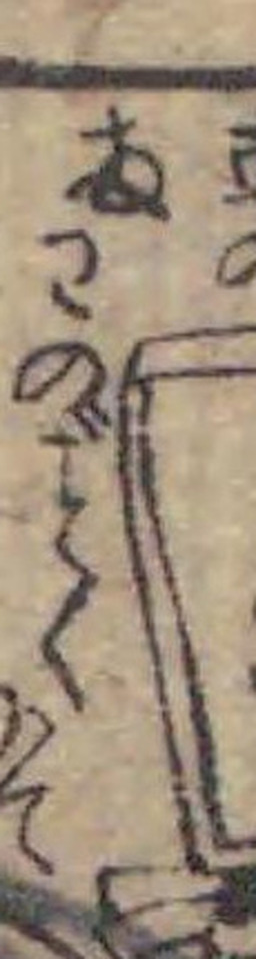両わのごとくにて
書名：三舛増鱗組 : 3巻
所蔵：国立国会図書館 National Diet Library, JAPAN
